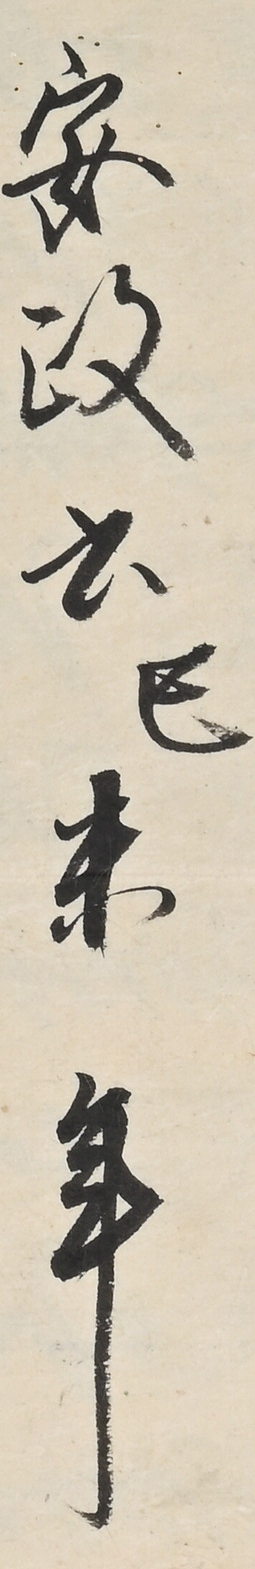安政六己未年
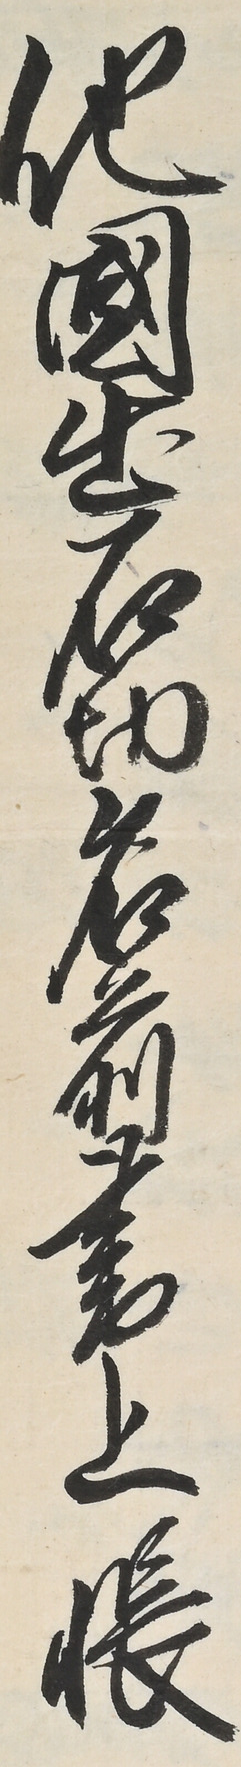他国出石切名前書上帳
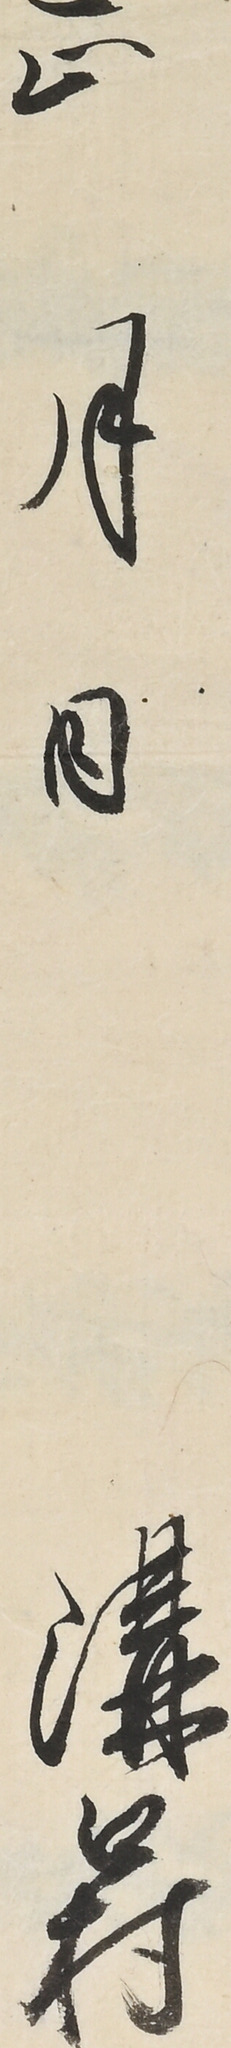正月日溝口村

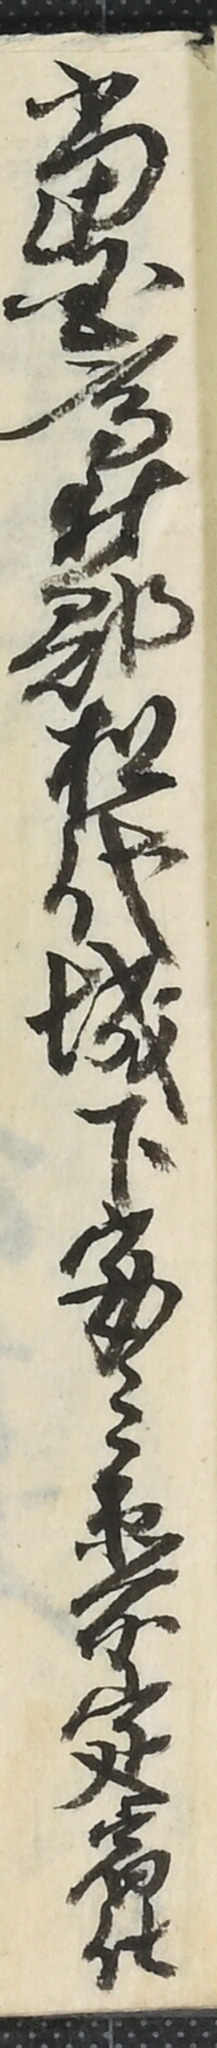当国高井郡松代城下安兵衛所定宿宿仕
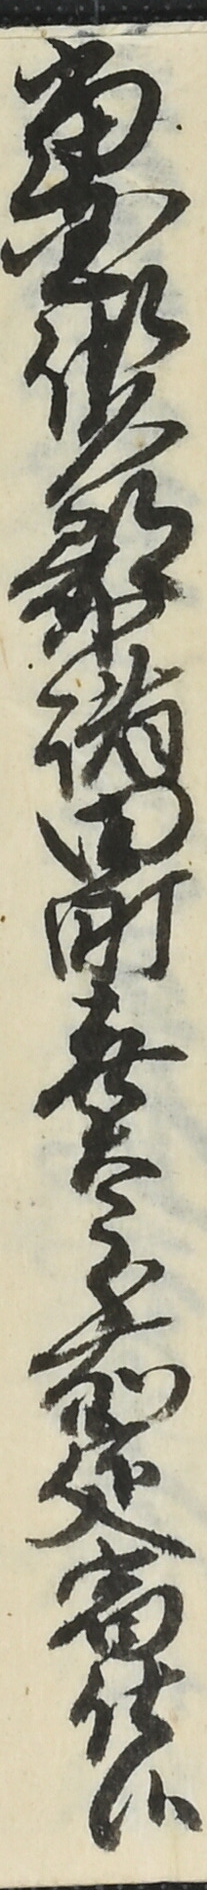当国佐久郡小諸田町喜太郎所定宿仕候
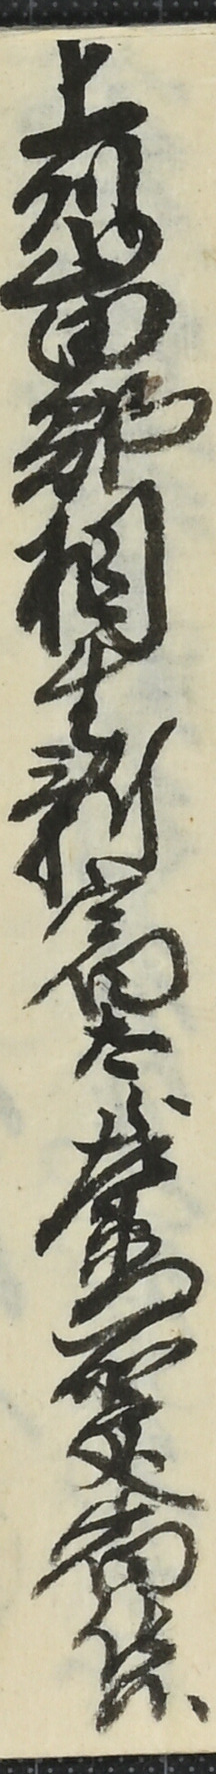上州山田郡桐生新宿太郎左衛門所定宿仕候

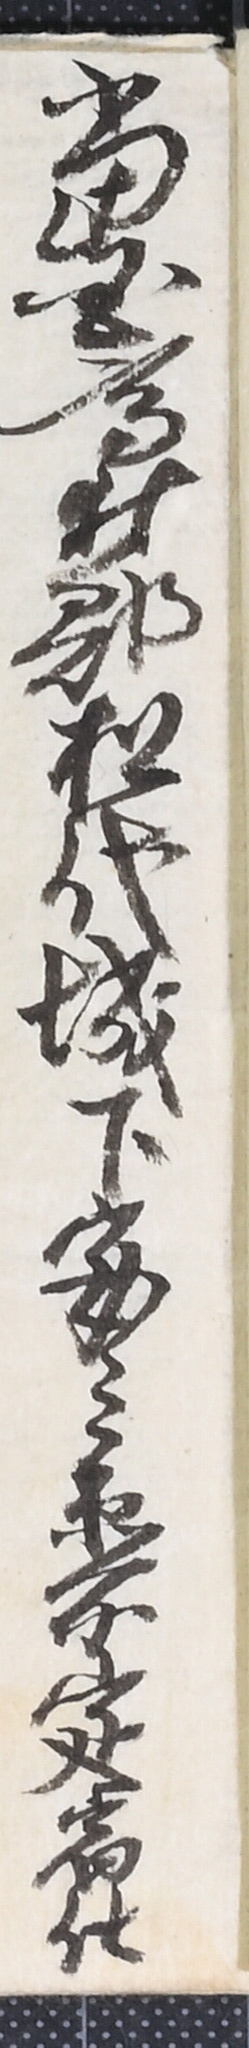当国高井郡松代城下安兵衛所定宿仕
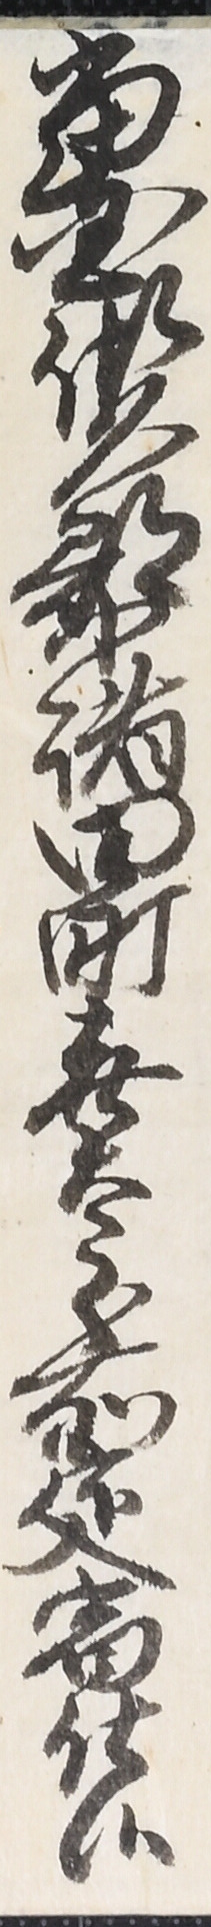当国佐久郡小諸田町喜太郎所定宿仕候
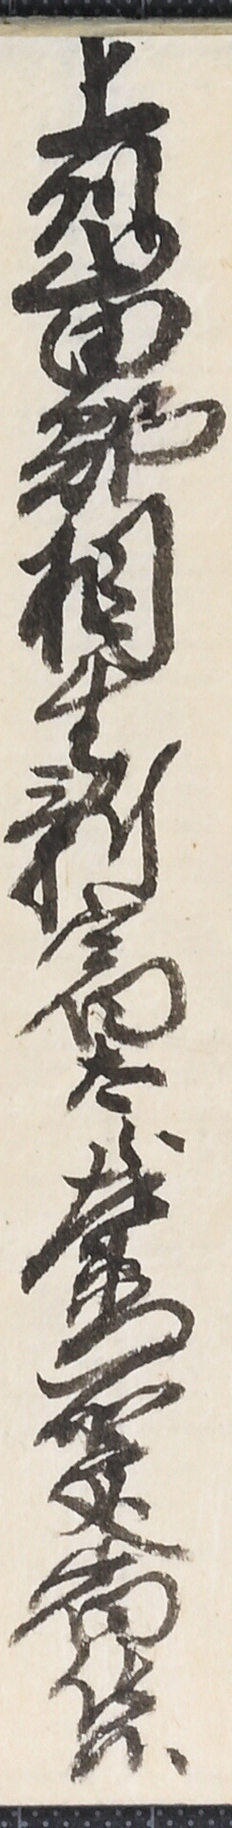上州山田郡相生新宿太郎左衛門所定宿仕候
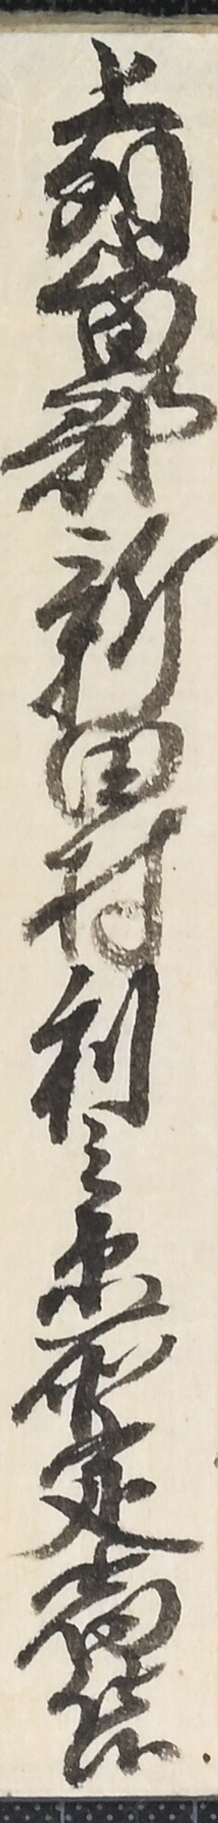上州山田郡新田村利兵衛所定宿仕候
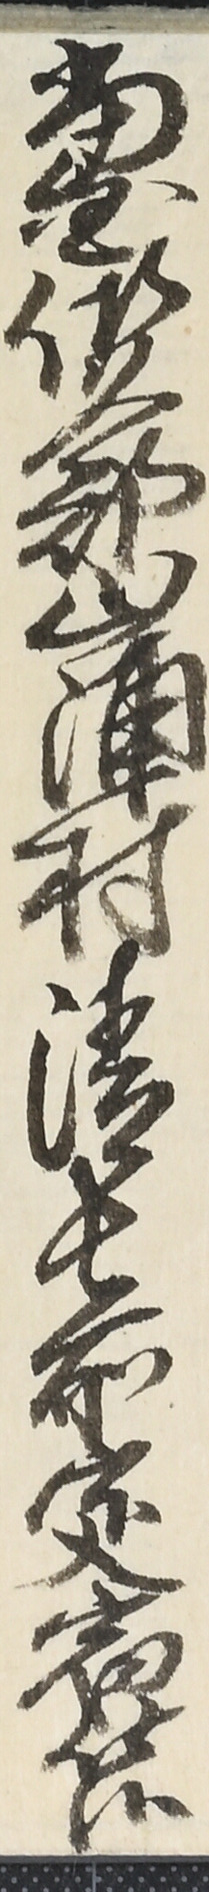当国佐久郡山浦村清七所定宿仕候
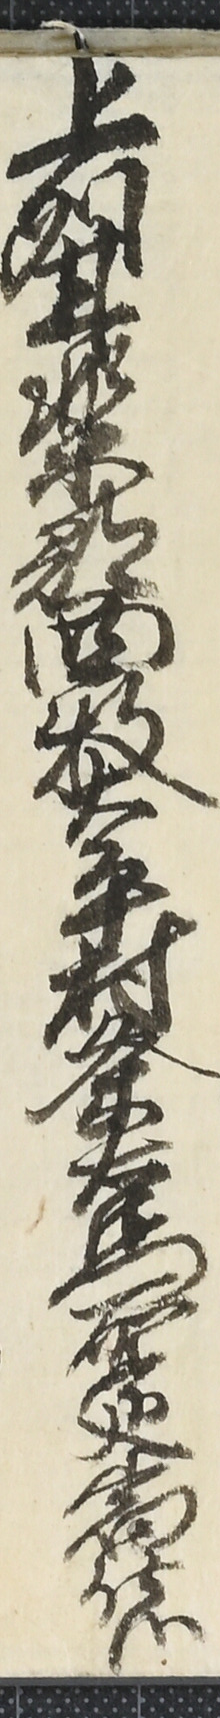上州甘楽郡西牧大平村久米右衛門所定宿仕候

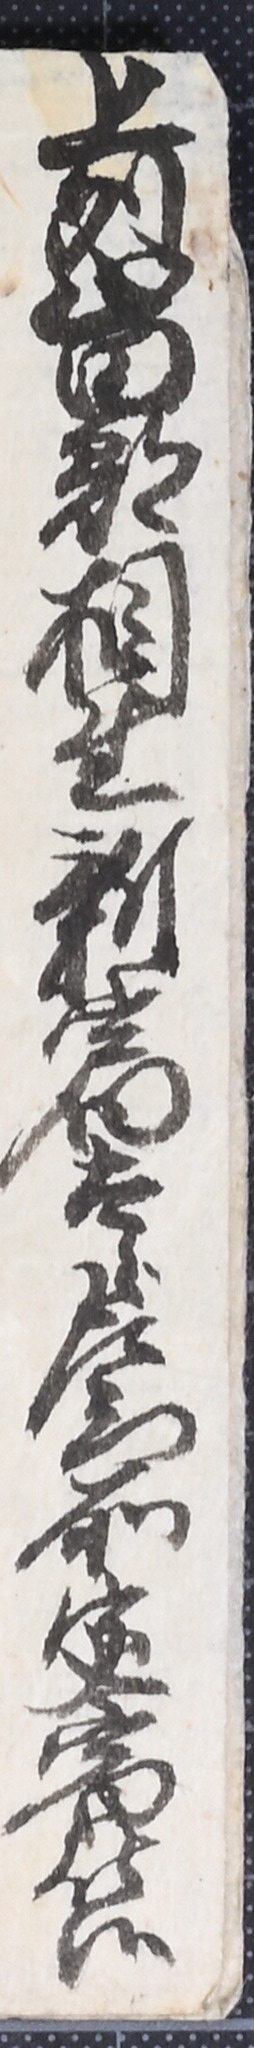上州山田相生新宿太郎左衛門所定宿仕候
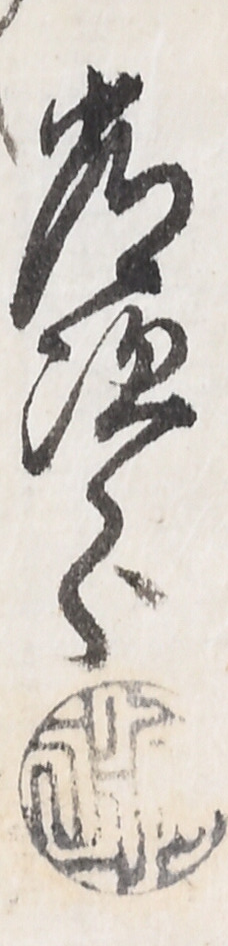常次郎㊞
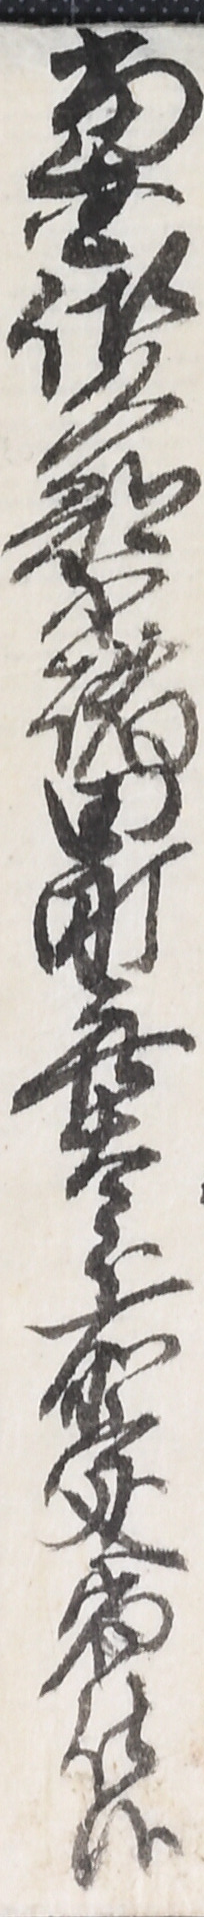当国佐久郡小諸田町喜太郎所定宿仕候
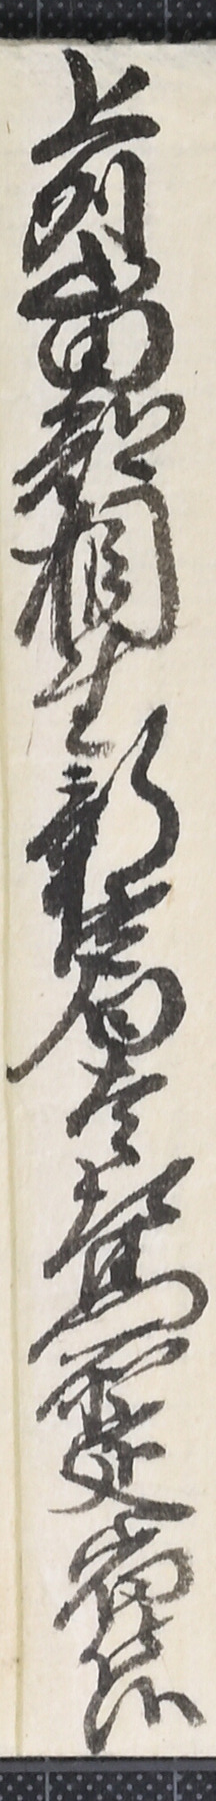上州山田郡相生新宿太郎左衛門所定宿仕候
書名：安政六己未年正月日他國出石切名前書上帳
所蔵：伊那市立高遠町図書館・合同会社AMANE
